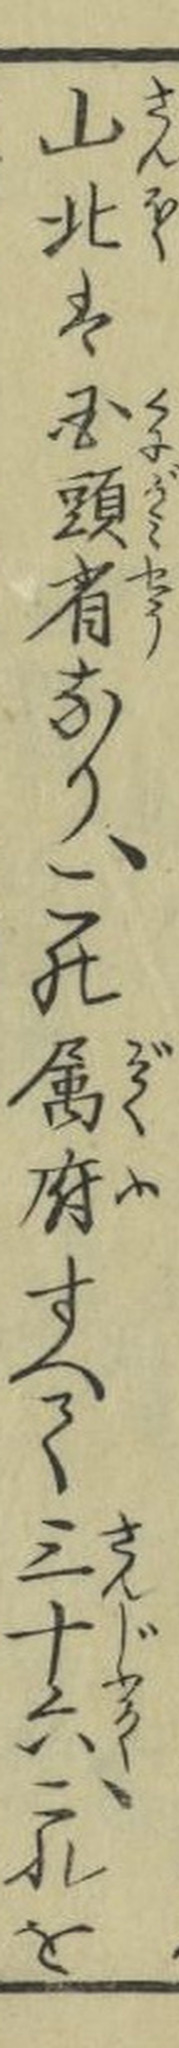山北は国頭省なり、この属府すへて三十六、これを
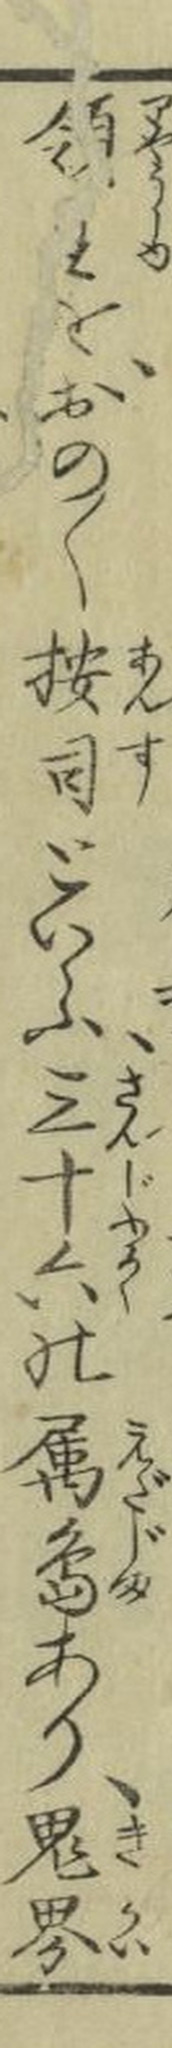領主を、おの〳〵按司といふ、三十六の属島あり、鬼界
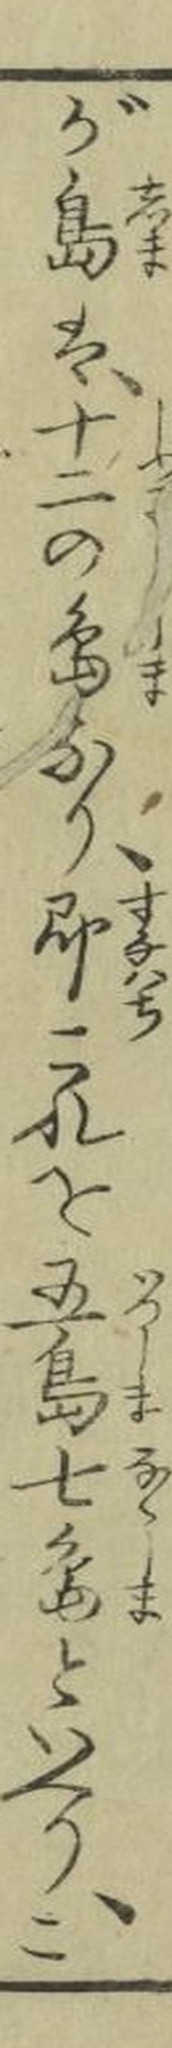が島は、十二の島なり、即これを五島七島といへり、こ
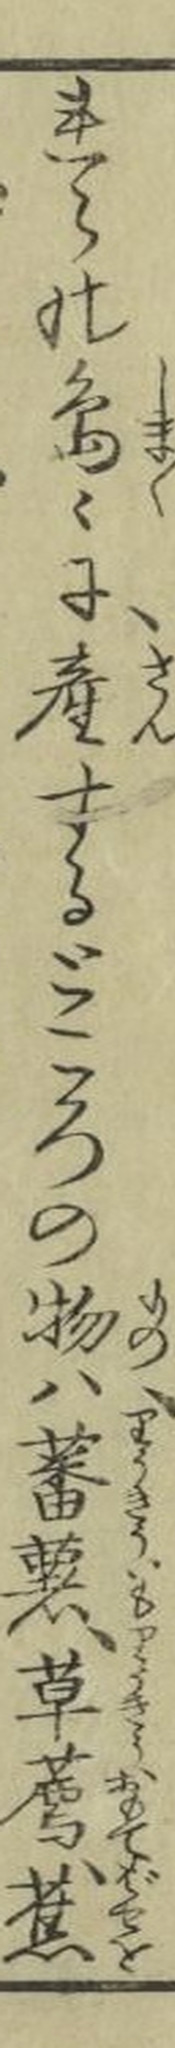れらの島々に、産するところの物は、蕃薯、草薦、蕉
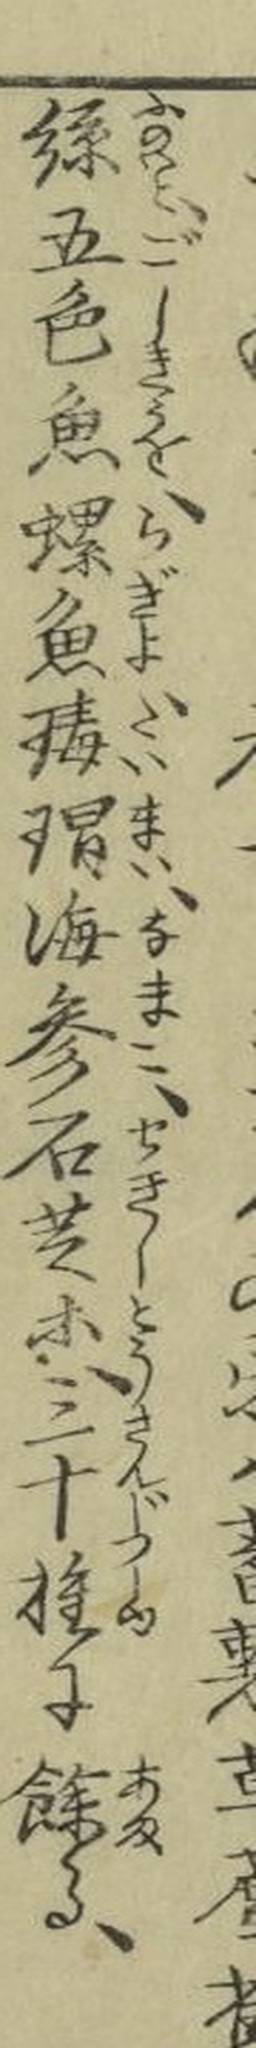絲、五色魚、螺魚、瑇瑁、海参、石芝等、三十種に余る、

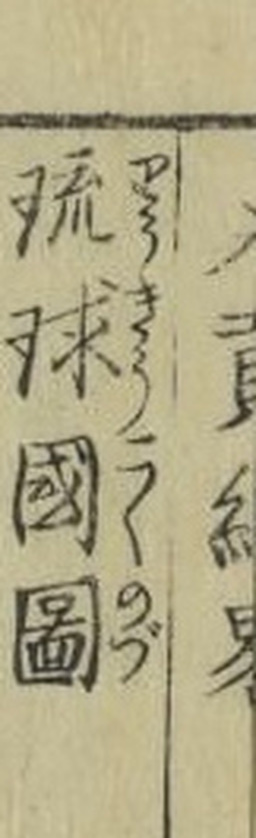琉球国図

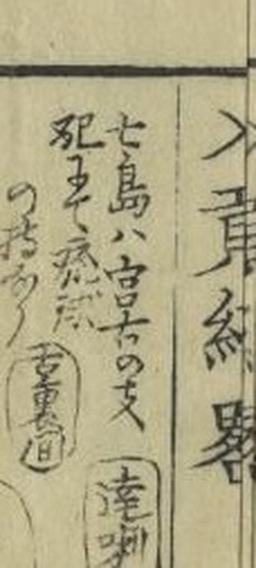七島は宮古の支
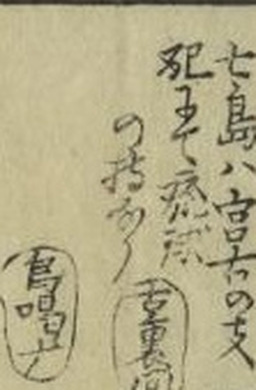の持なり
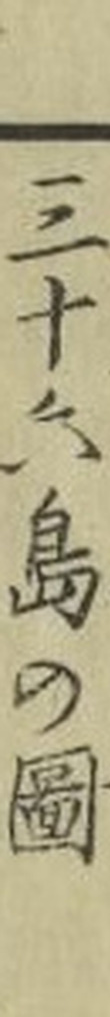三十六島の図
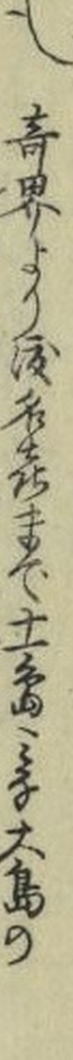奇界より渡名喜まで十一島みな大島の
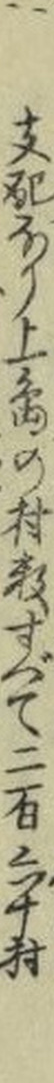支配なり上島の村数すべて二百六十村
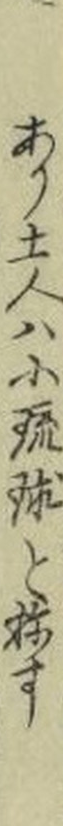あり土人は小琉球と称す
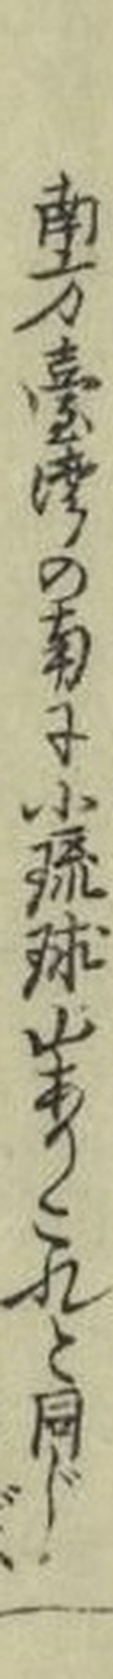南方台陸の南に小琉球山ありこれと同じ
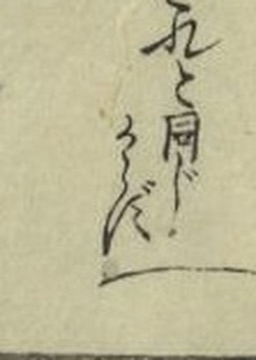からず
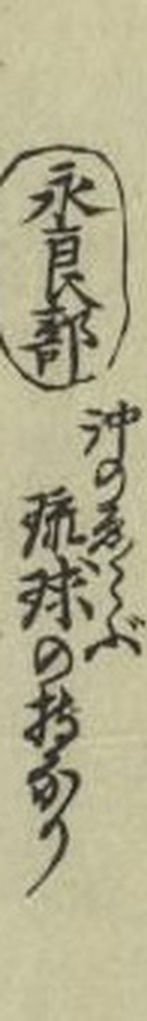琉球の持なり
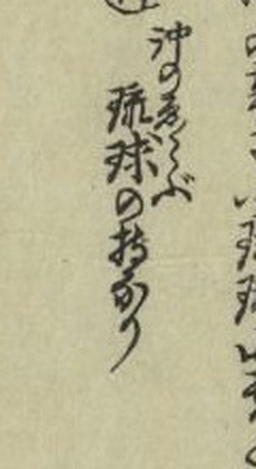琉球の持なり
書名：琉球入貢紀略
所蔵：University of the Ryukyus Library
